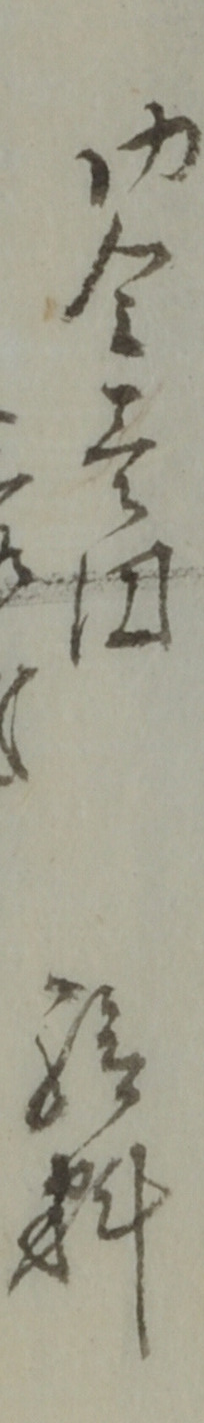金壱円給料
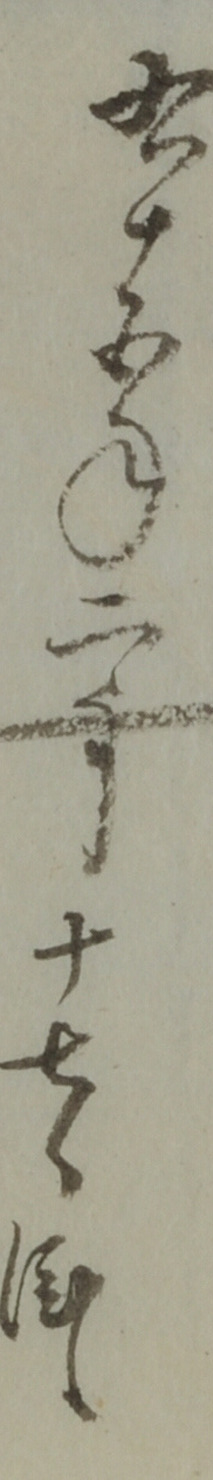右十五年二月十七日渡し

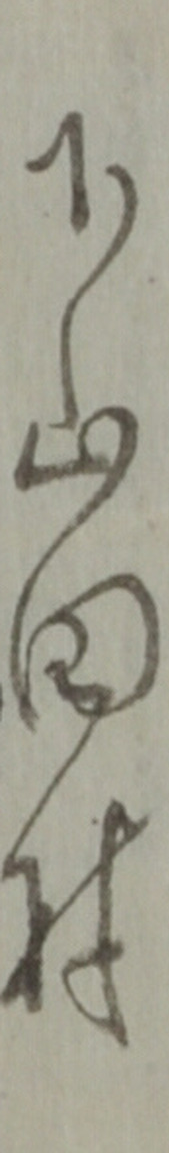下山田村
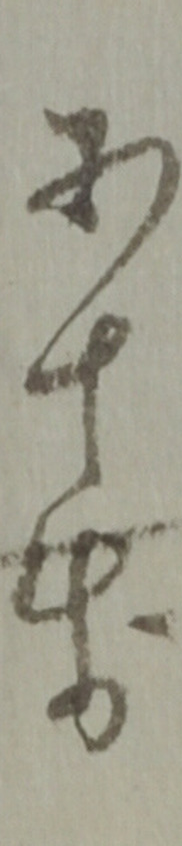五十銭

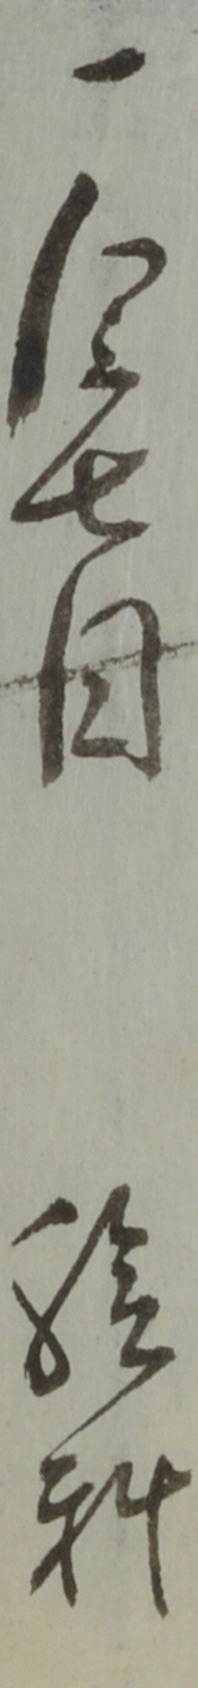一金七円給料
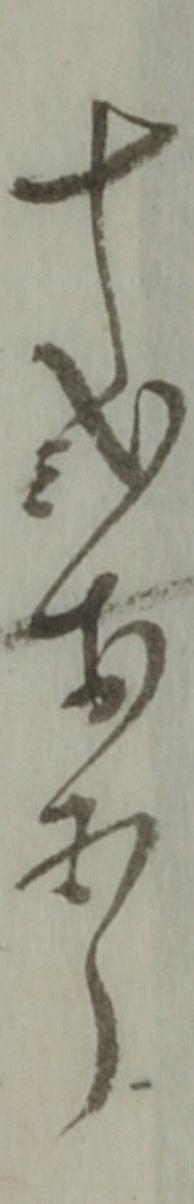十弐銭五歩

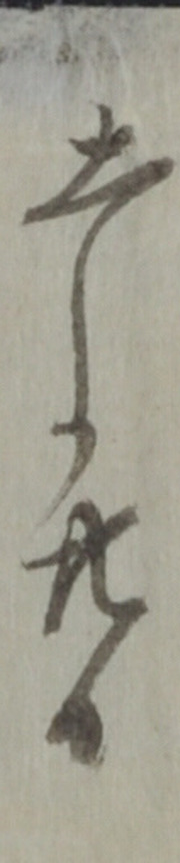十一月廿日
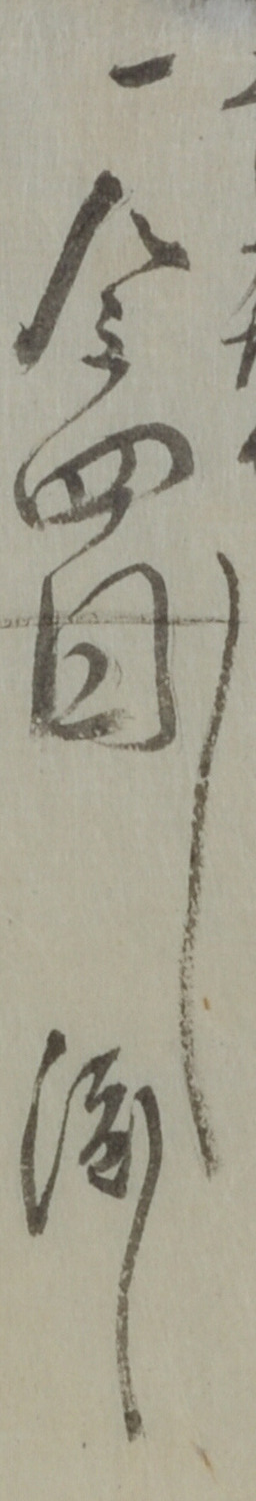一金四円渡し
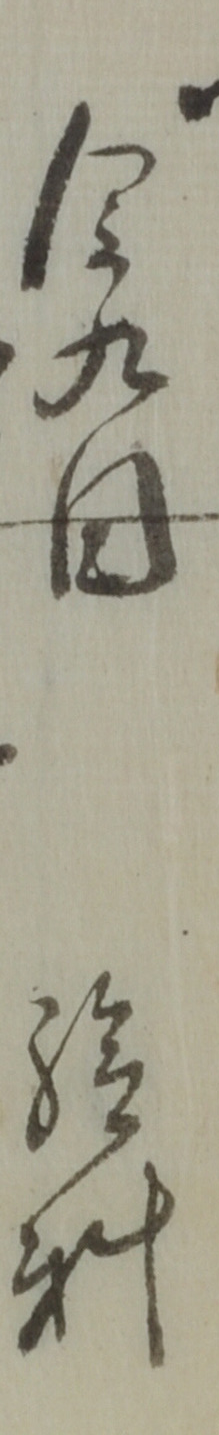金九円給料
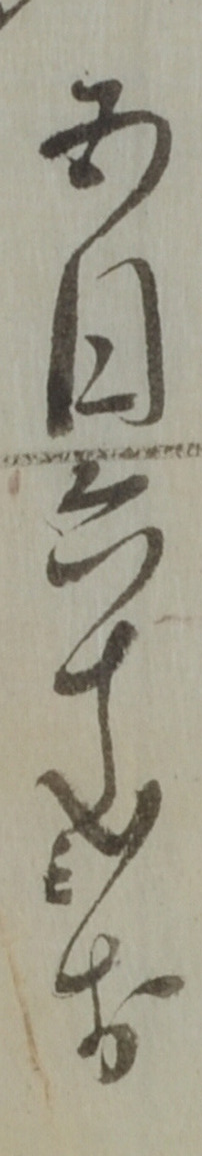〆五月六十弐銭
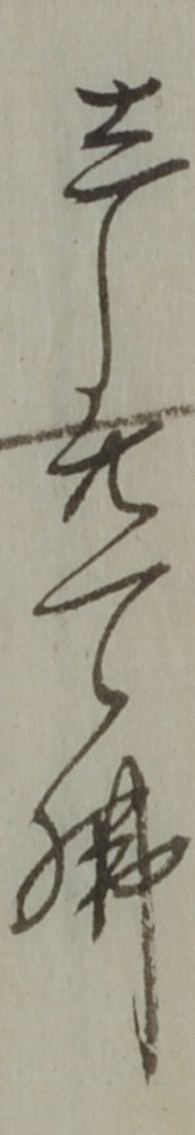十一月廿日

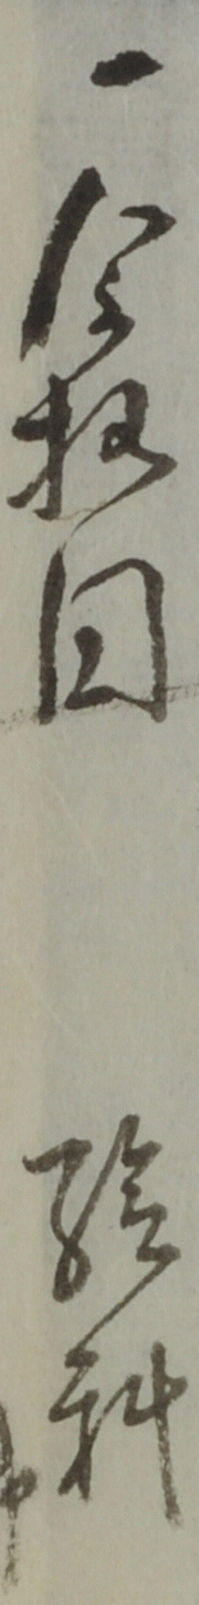一金拾円給料

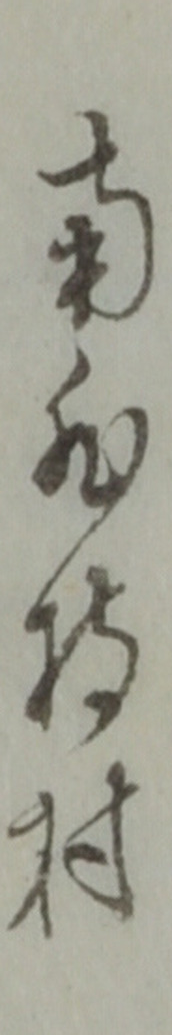南非持村
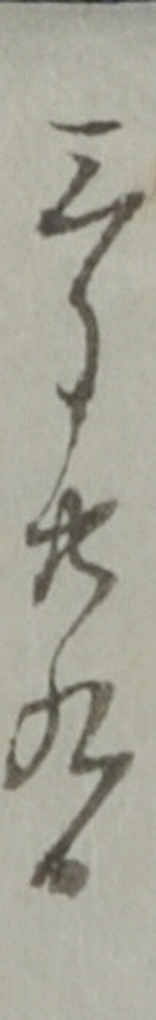三月廿九日
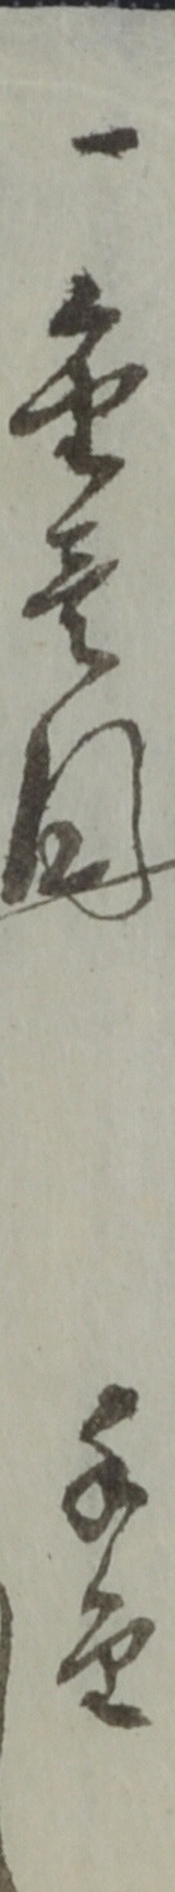一金壱円手重
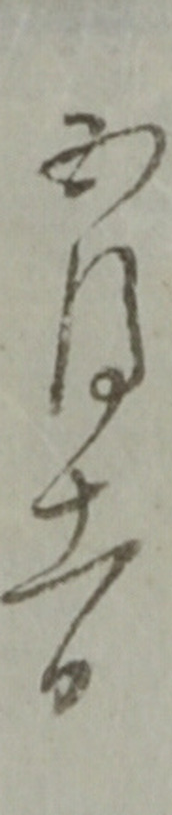五月十一日
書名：工女名前並金員渡諸事控
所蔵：伊那市立高遠町図書館・合同会社AMANE
